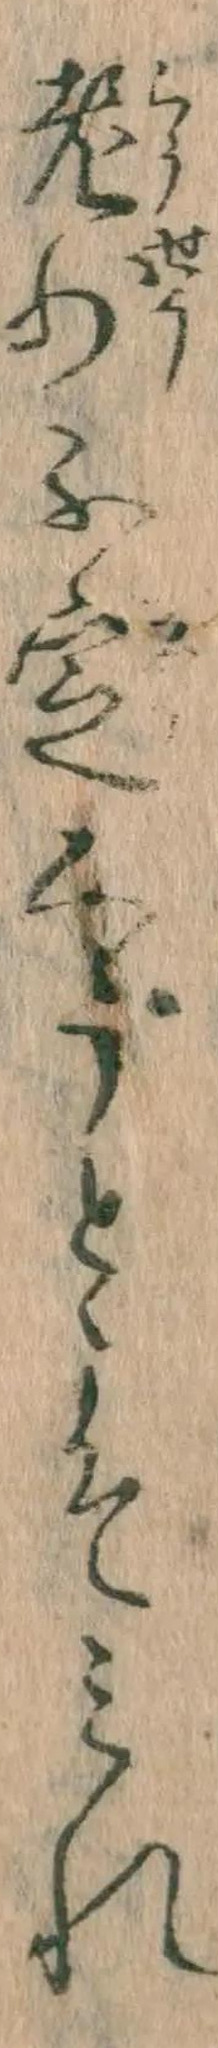老少不定くうとこそみれ

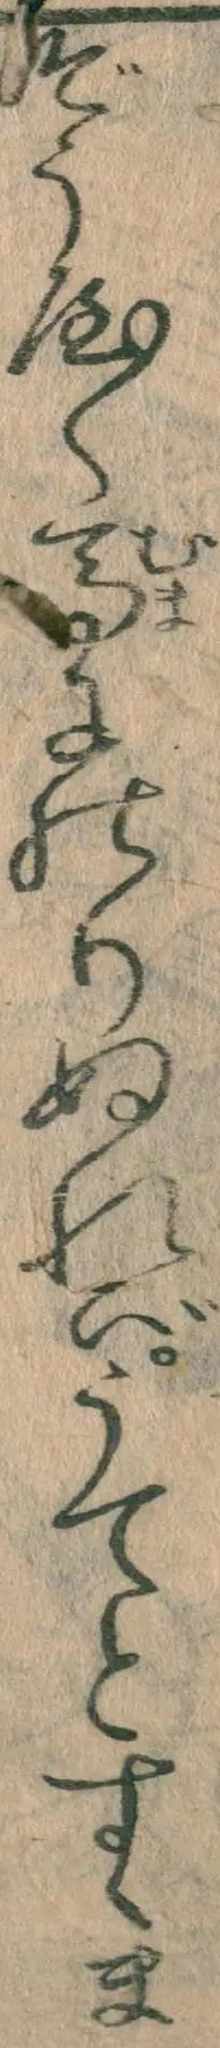ぞうやく馬にのりぬれば。うてとすゝま
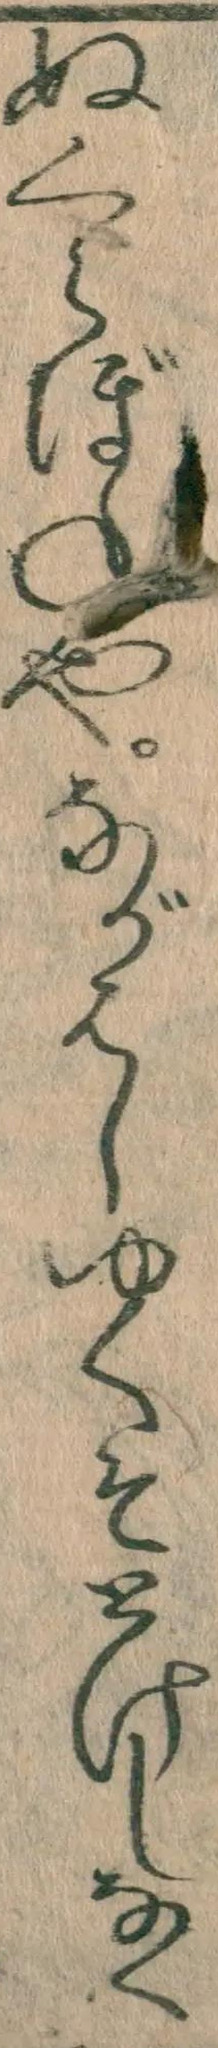ぬくらぼねや。ながはしゆくもとけしなく
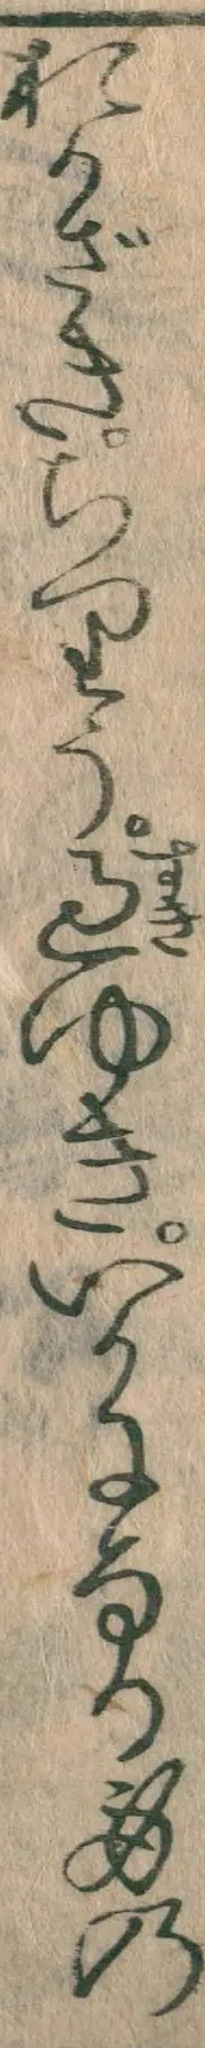おかざき。ちりう。過ゆき。いかになる身の
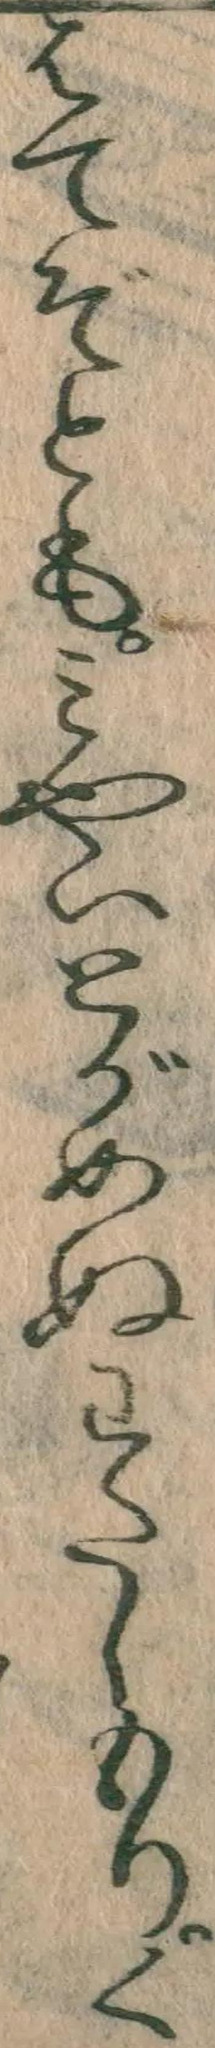はてぞとも。みやはとがめぬわたしもり。く
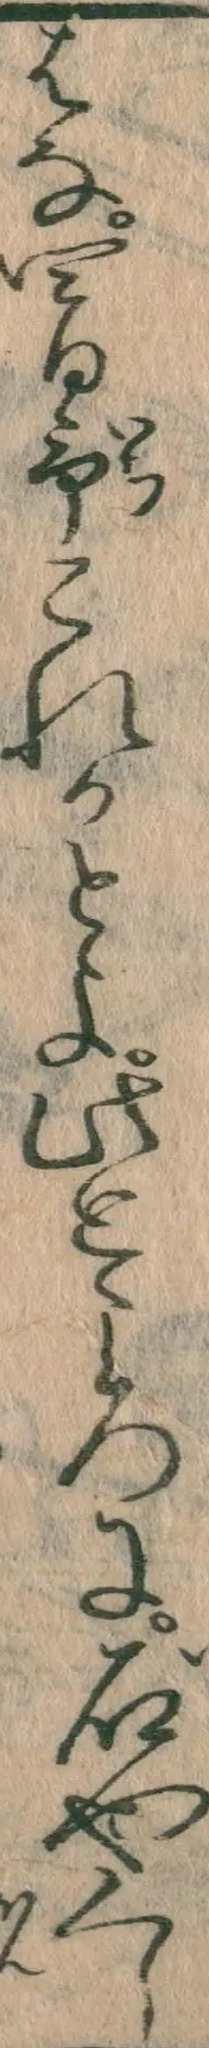はな。四日市これかとよ。此ところに。石やくし
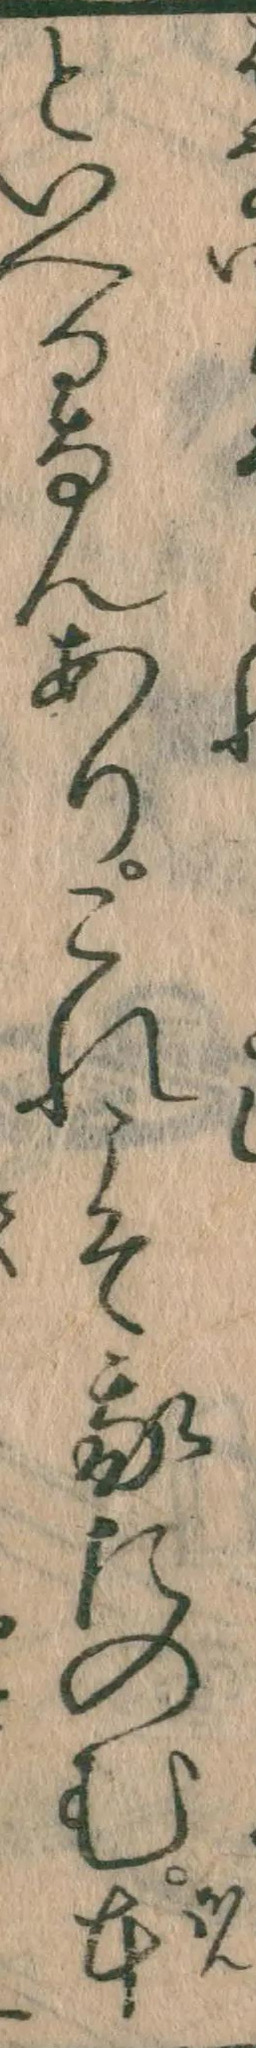といへるなんあり。これこそ我たのむ。本
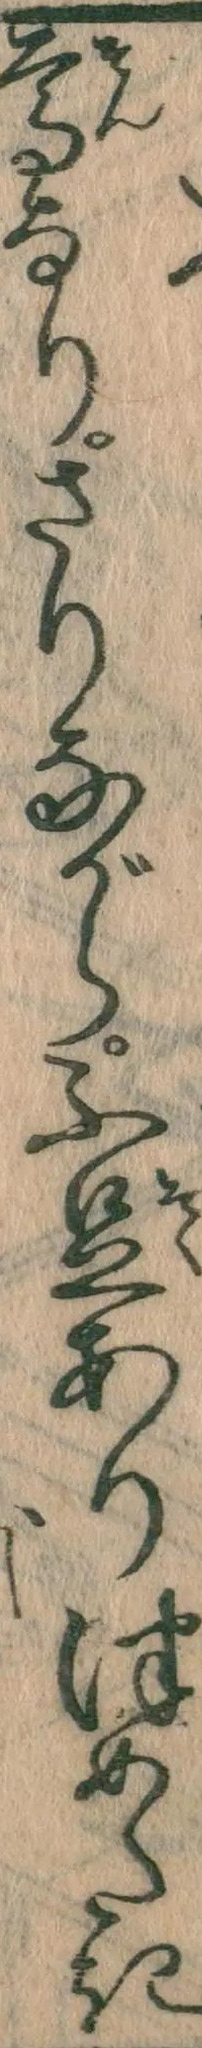尊なり。さりながら。不足ありつめたき
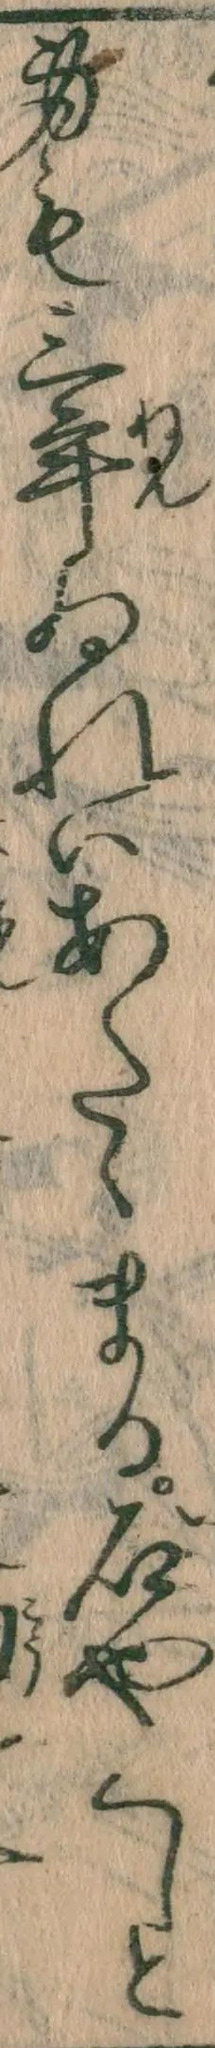身も三年ゐれはあたゝまる。石やくしと
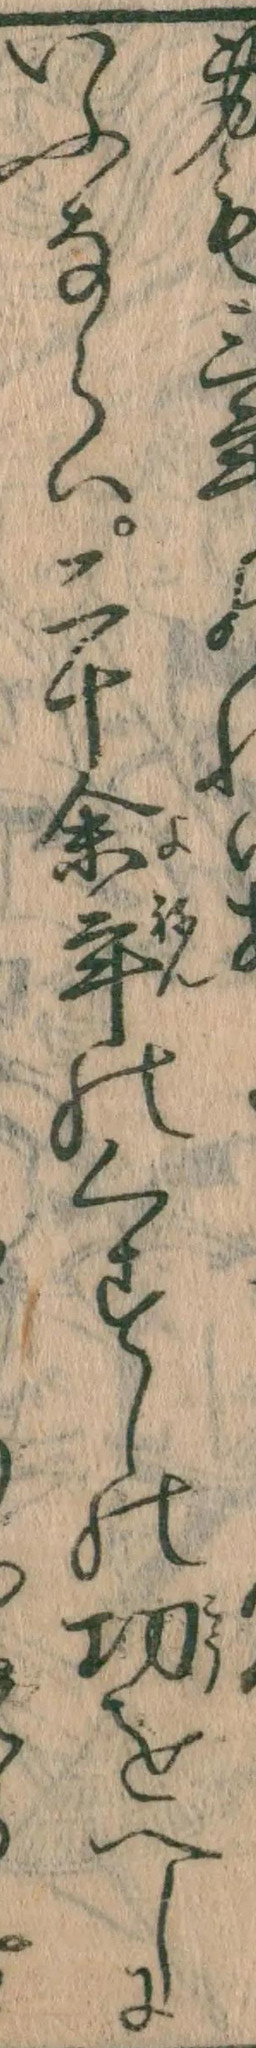いふならは。二十余年のくすしの功をへしに
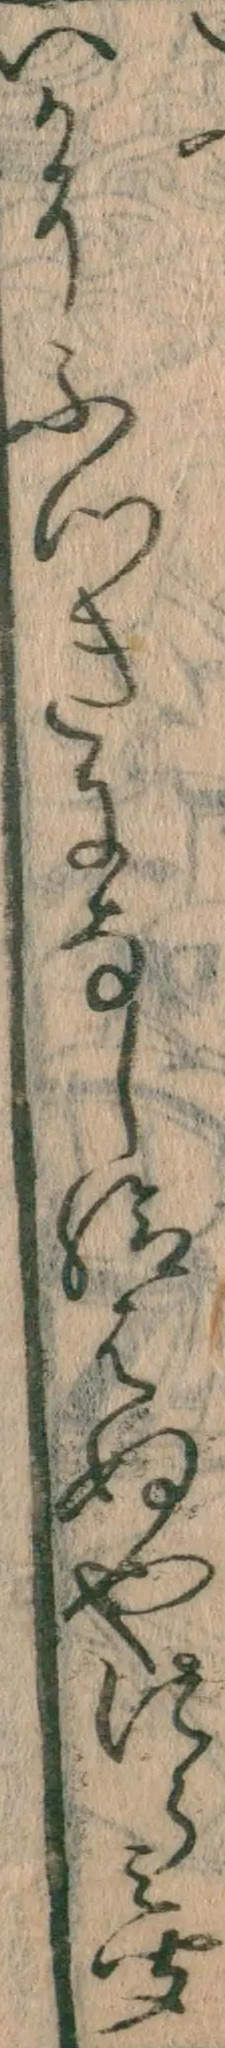いかにふつきになし給はぬやにらみ聞
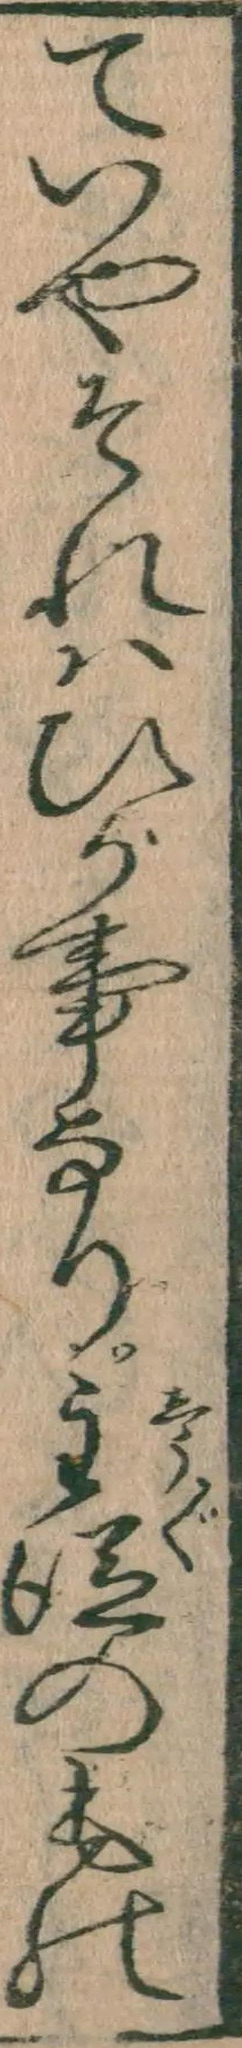ていやそれはひが事なり。主従のもの
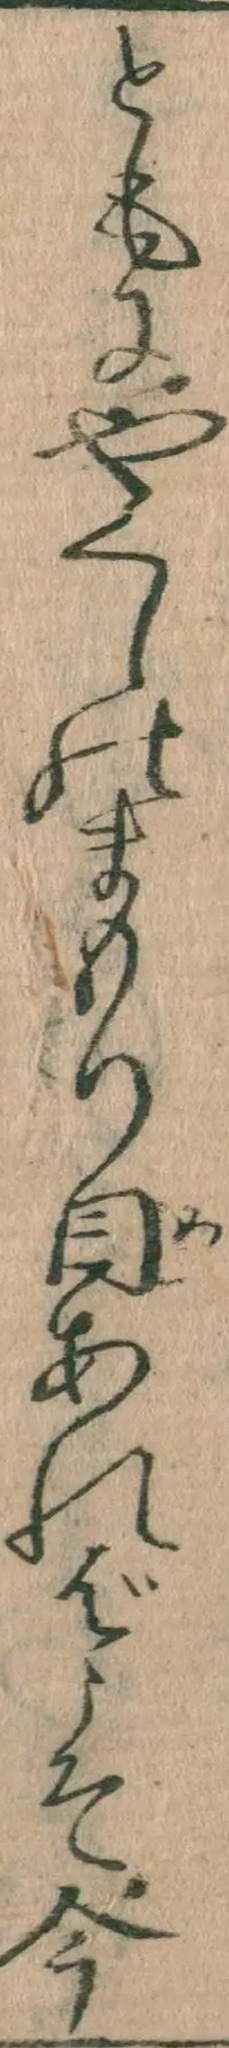ともに、やくしのまもり目あればこそ、今
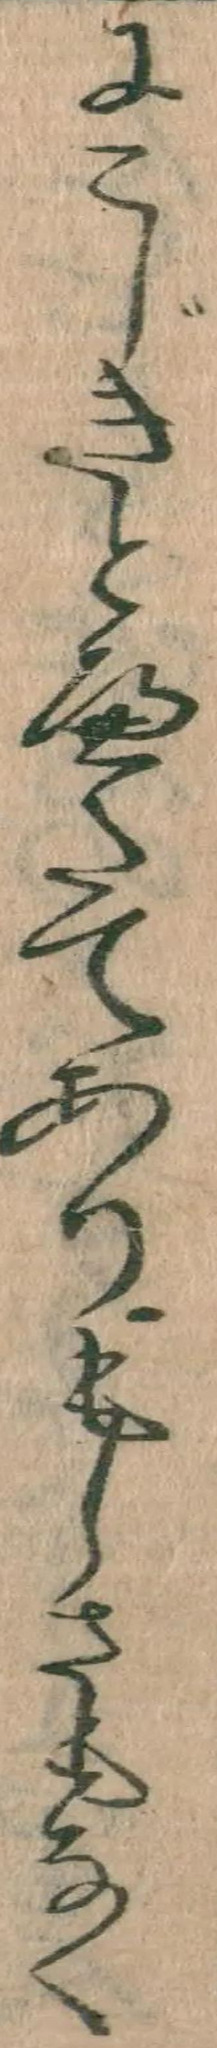にこじきとへたてあり、もしさもなく
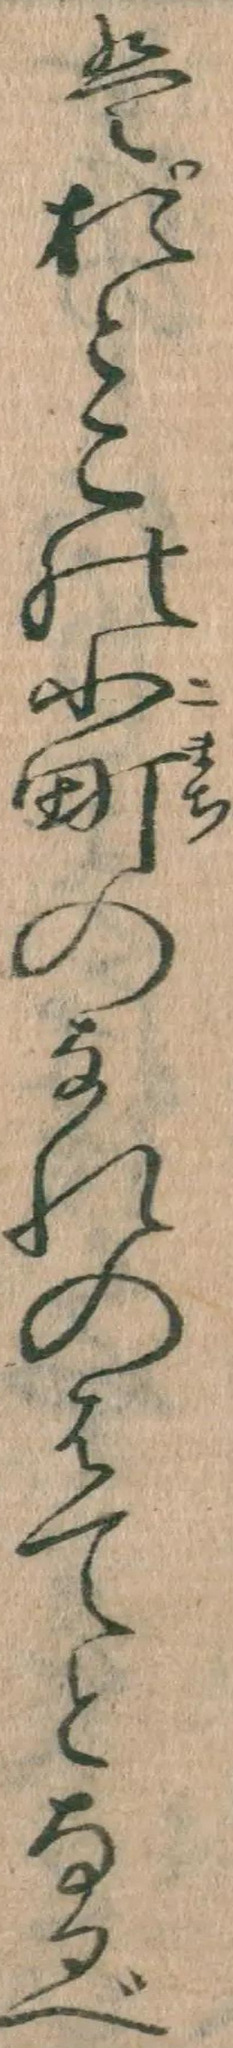は。おとこの小町のなれのはてとなるべ
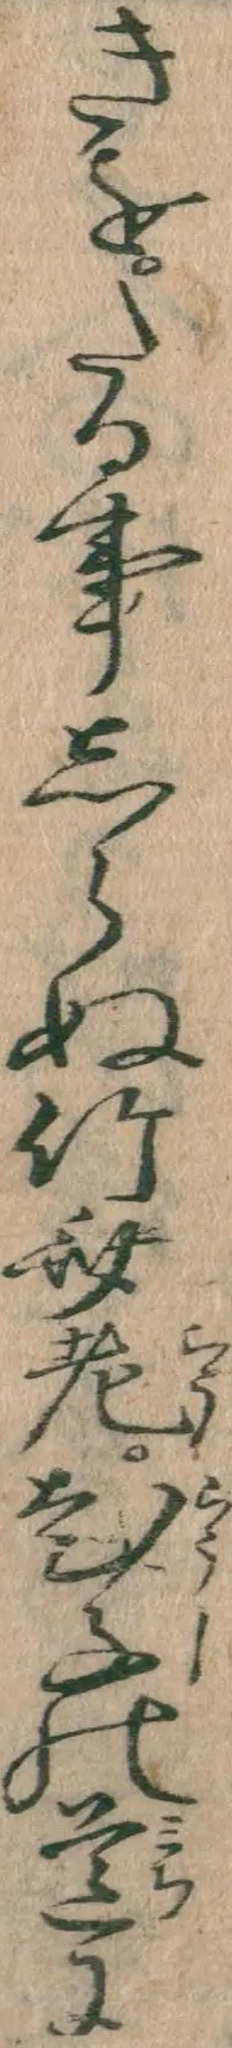きを。たる事しらぬ竹斎老。老子の道に
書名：竹斎狂歌物語 3巻
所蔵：国立国会図書館 National Diet Library, JAPAN
